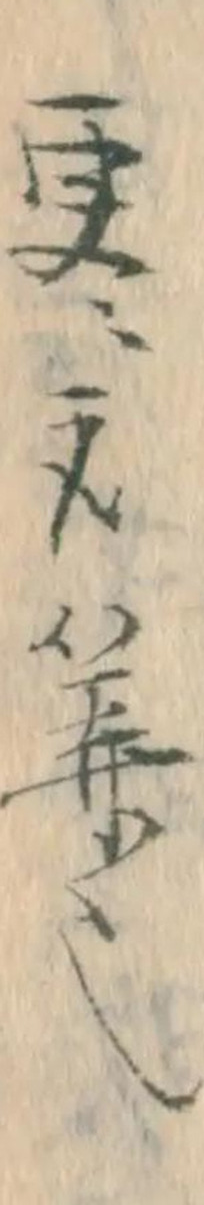更ニ取算也

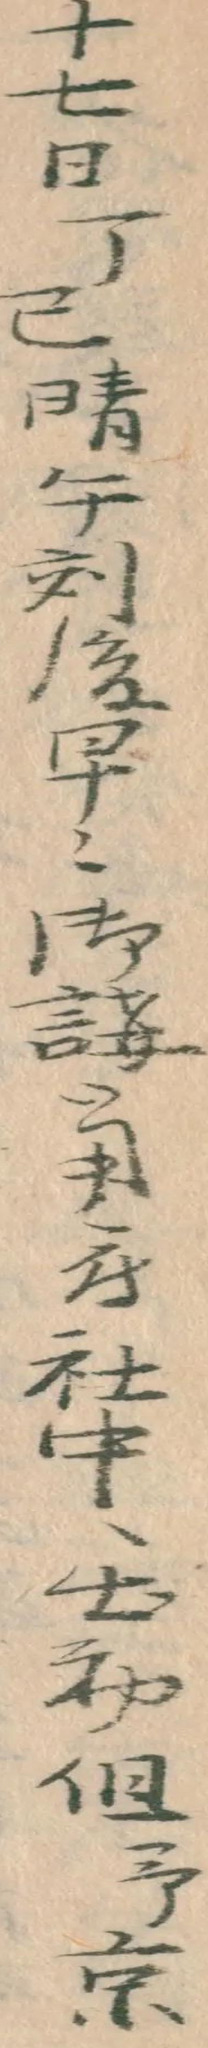十七日丁巳晴午刻後早々御講御用ニ付社中へ出勤但予京
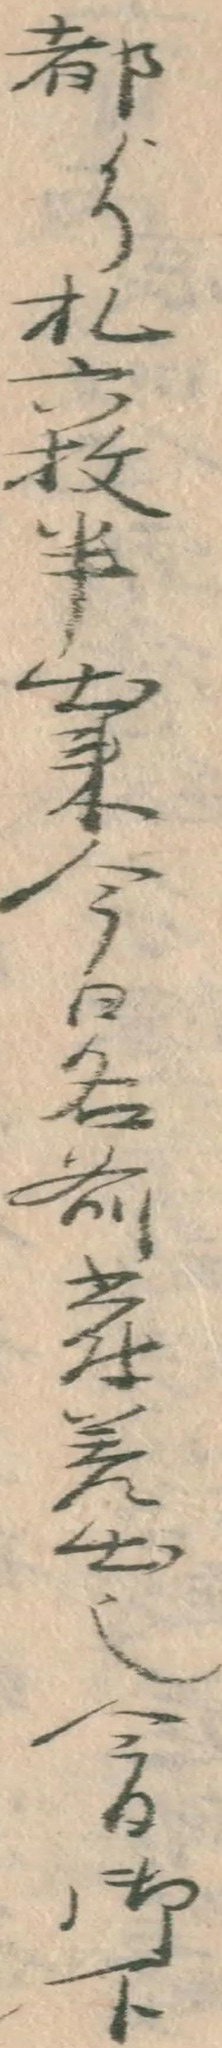都より札六枚半出来今日名前書付差出也今日御下
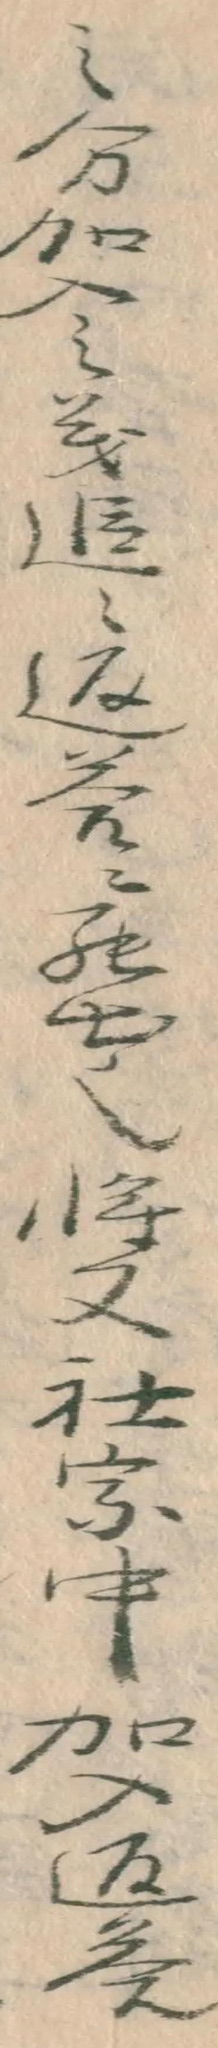之分加入之義追々返答ニ罷出也将又社家中加入返答
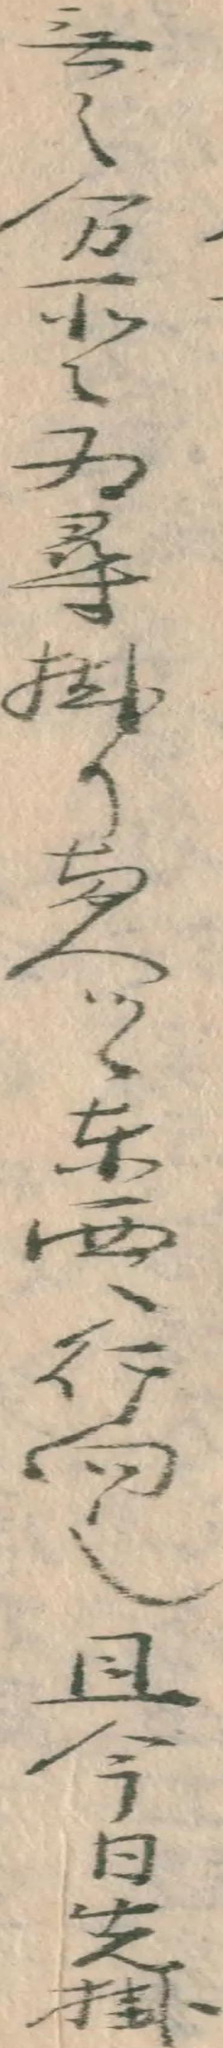無之分所々為尋掛り両人ツゝ東西へ行向也且今日先掛
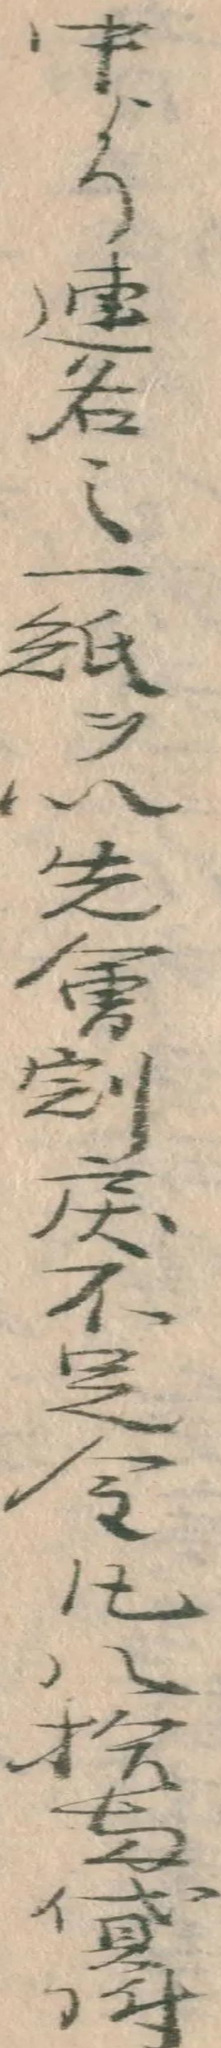中より連名之一紙ヲ以先会割戻不足金凡八拾両貸附
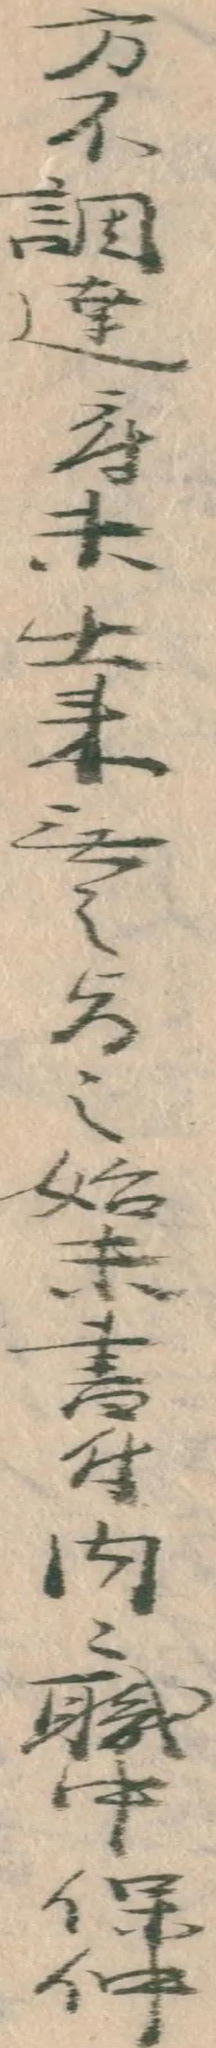方不調達ニ付未出来無之旨之始末書付内々職中保仲
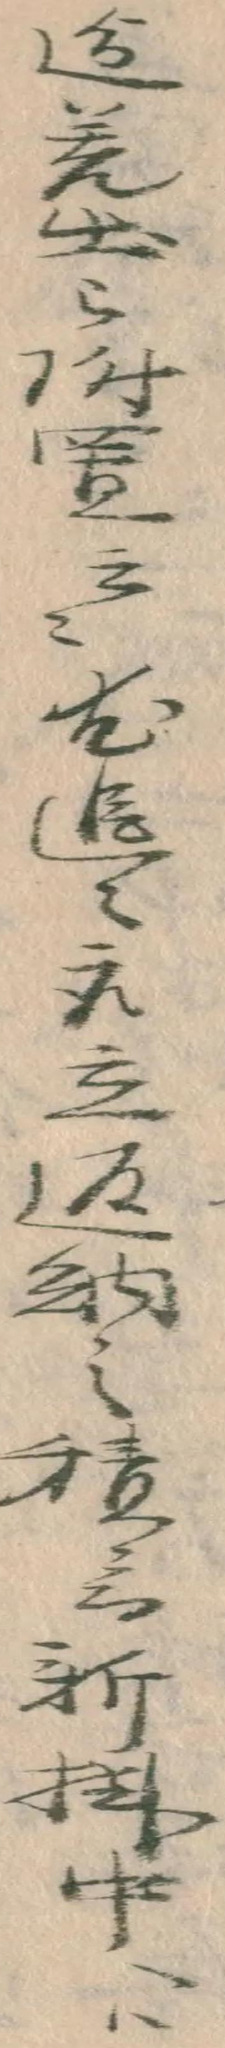迄差出被附置云々尤追々取立返納之積ニ而新掛中へハ
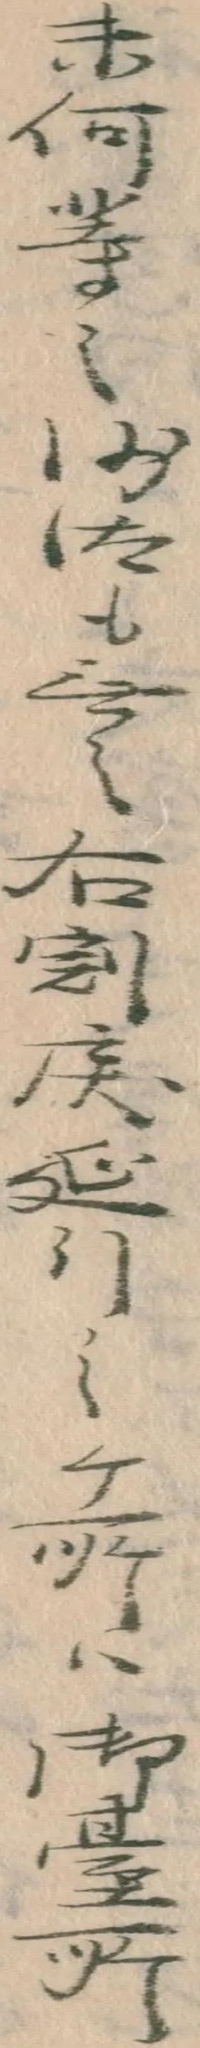未何等之沙汰も無之右割戻延引之ヶ所ハ御臺所
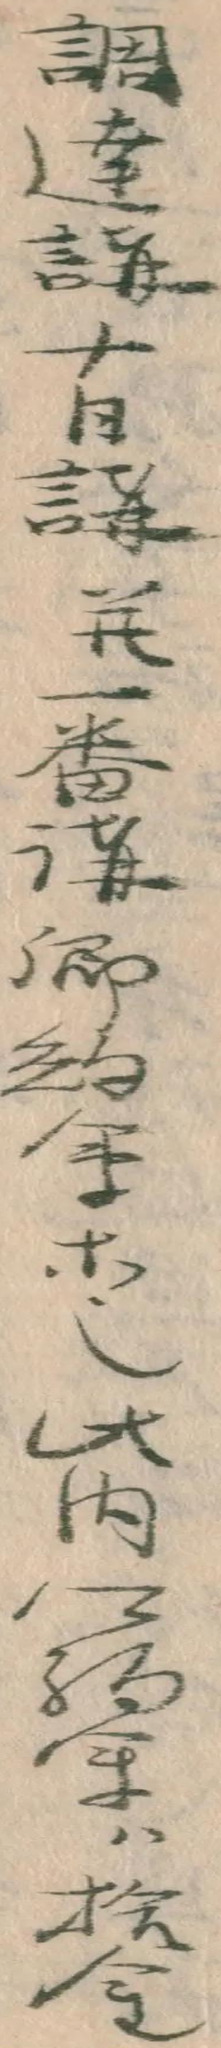調達講十日講并一番講郷約会也此内郷約会ハ拾金
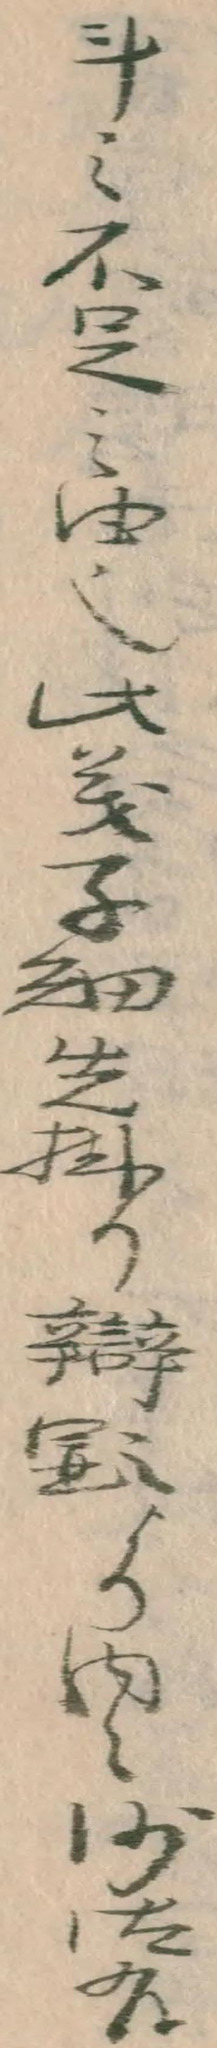斗之不足之由也此義子細先掛り弁顕より内々沙汰有
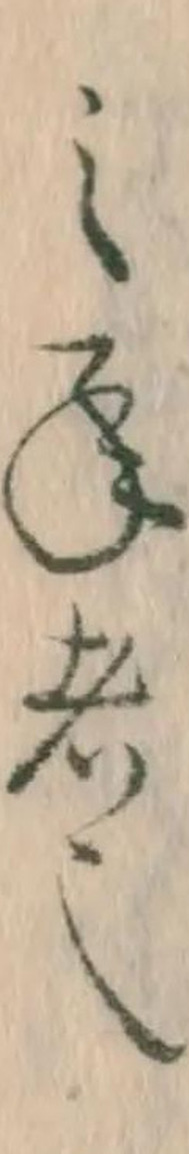之承者也
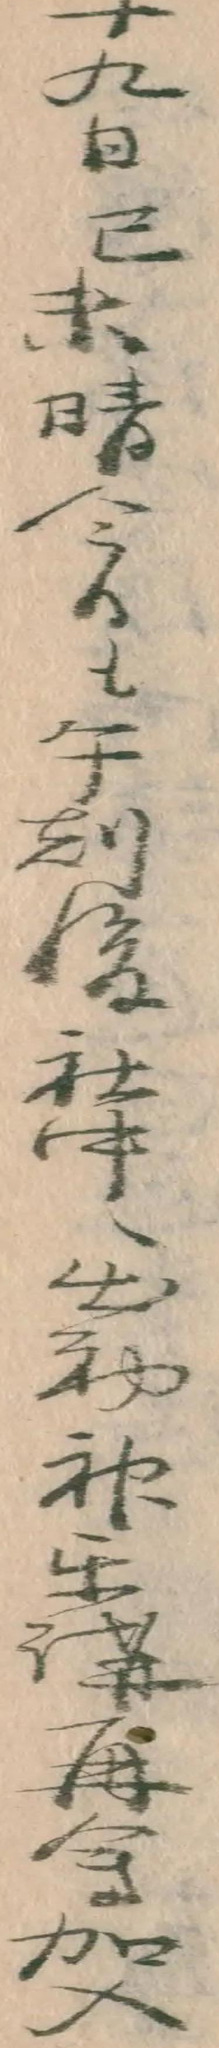十九日己未晴今日も午刻後社中へ出勤神楽講再会加入
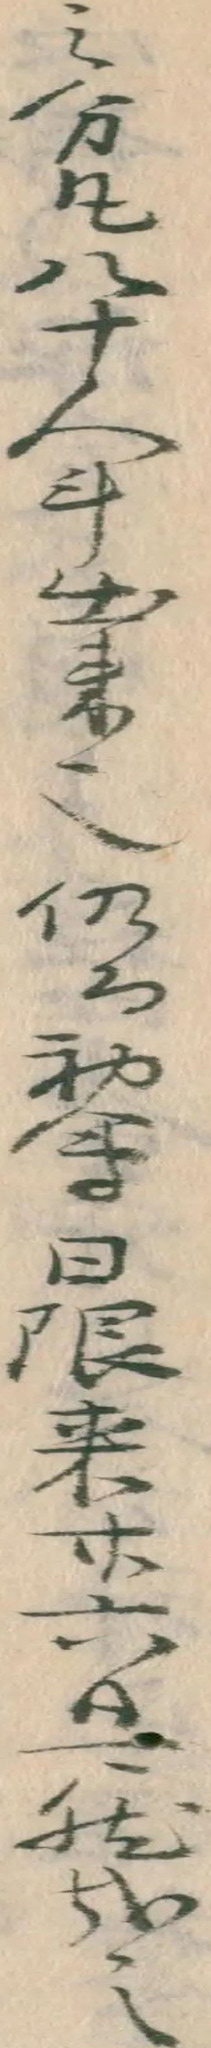之分凡八十人計出来也仍而初会日限来廿六日可然哉之
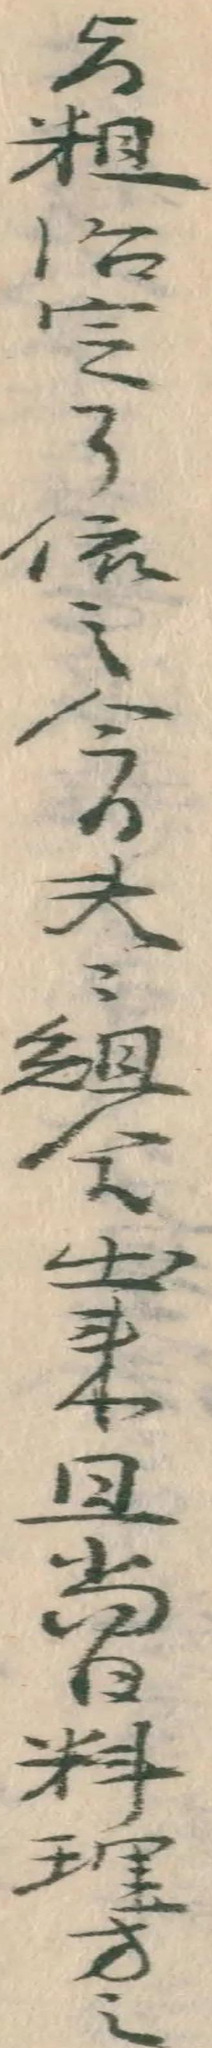旨粗治定了依之今日夫々組合出来且当日料理方之
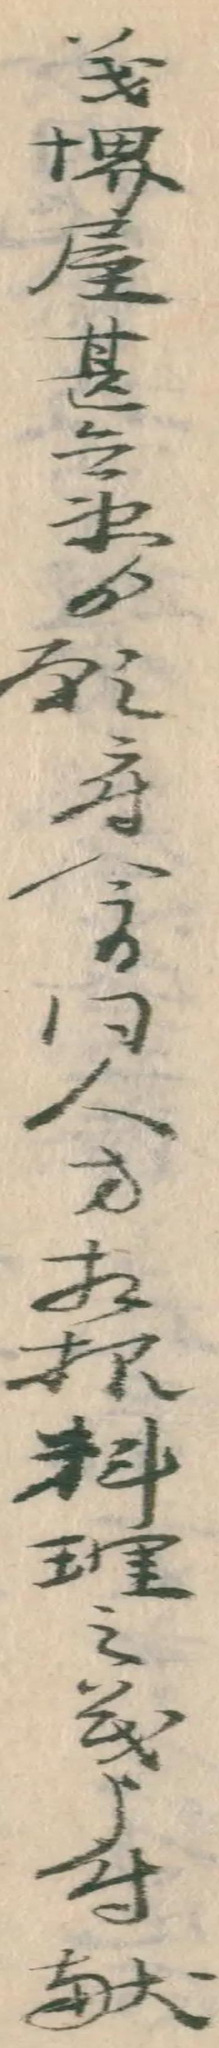義堺屋甚兵衛ゟ願ニ付今日同人方相択料理之義申付献
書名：賀茂社記録. 第64冊
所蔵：国立国会図書館 National Diet Library, JAPAN
